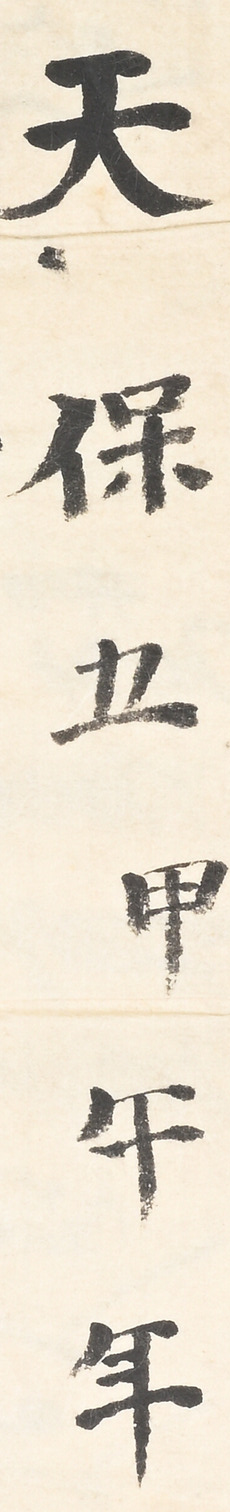天保五甲午年
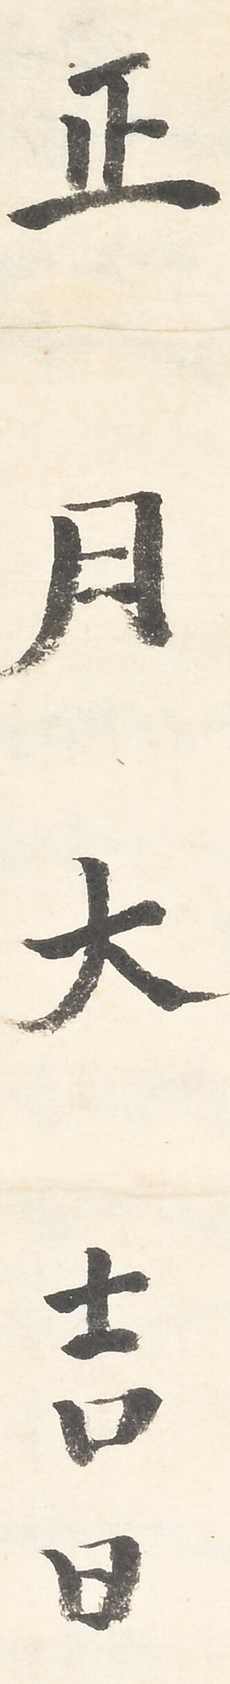正月大吉日
